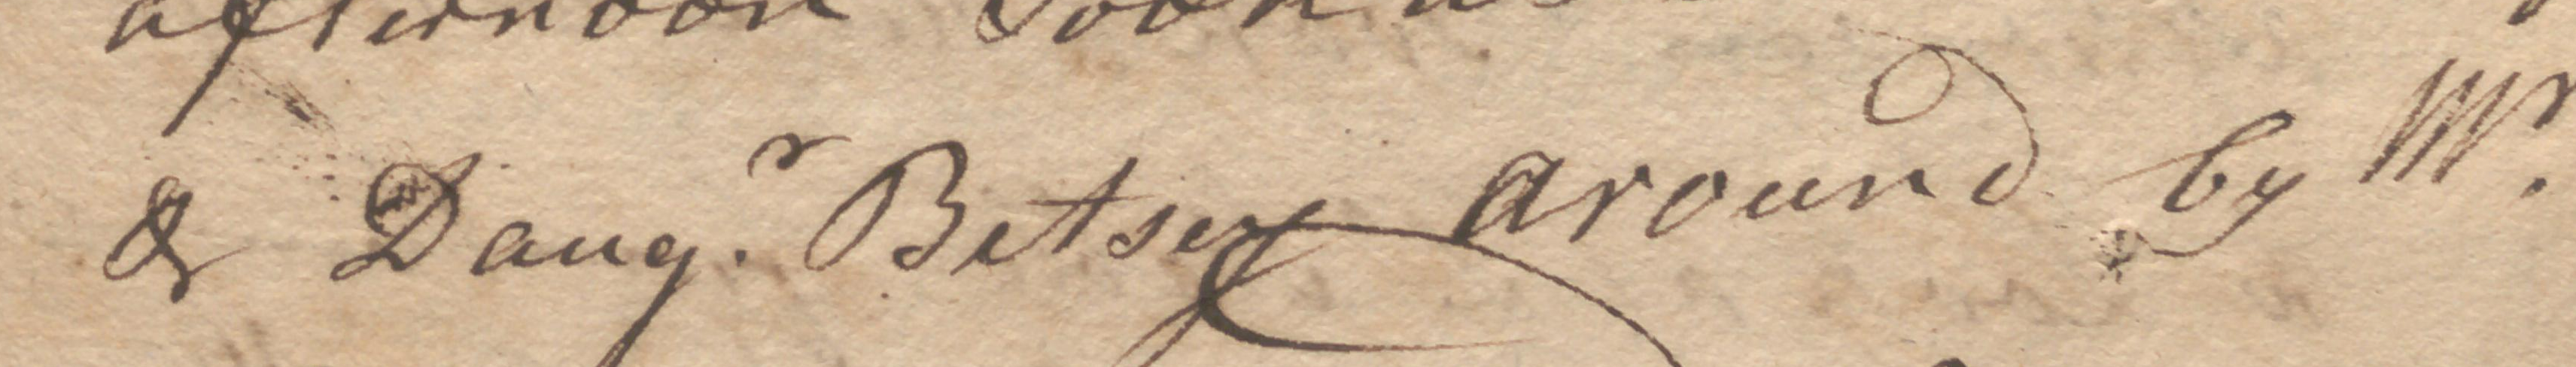& Daug^r. Betsey around by M^r
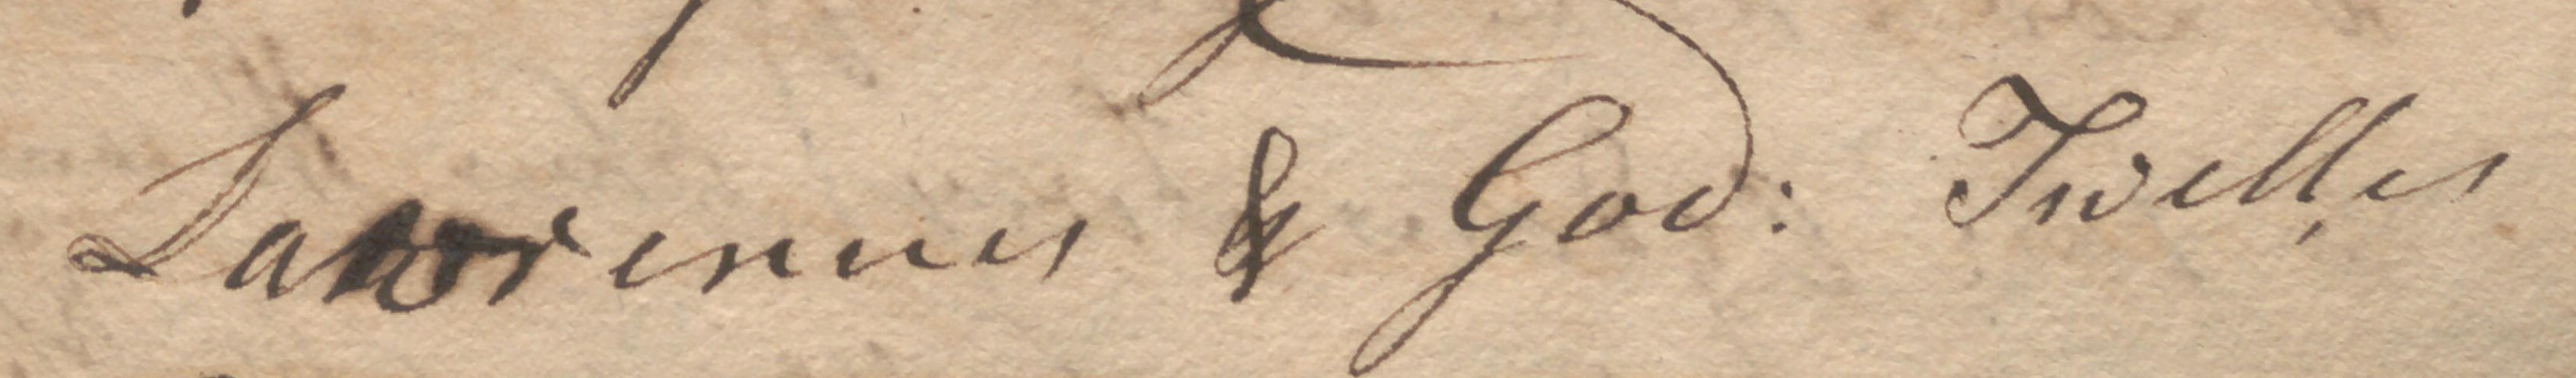Lawrences & God: Twettes
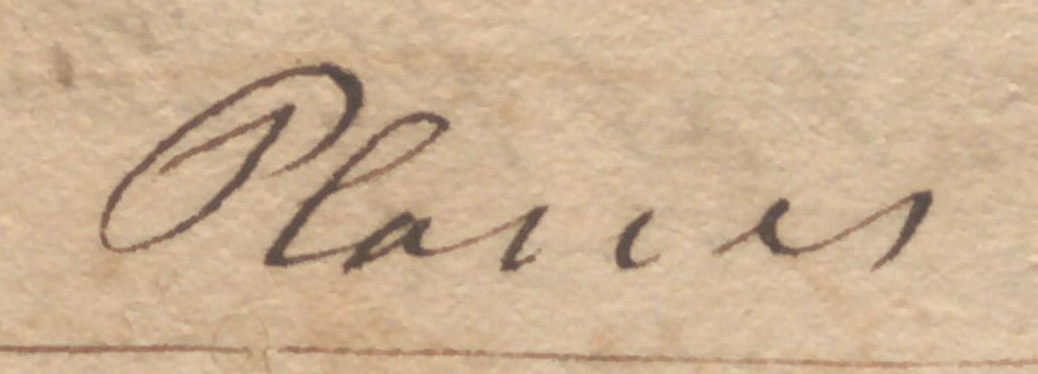Places
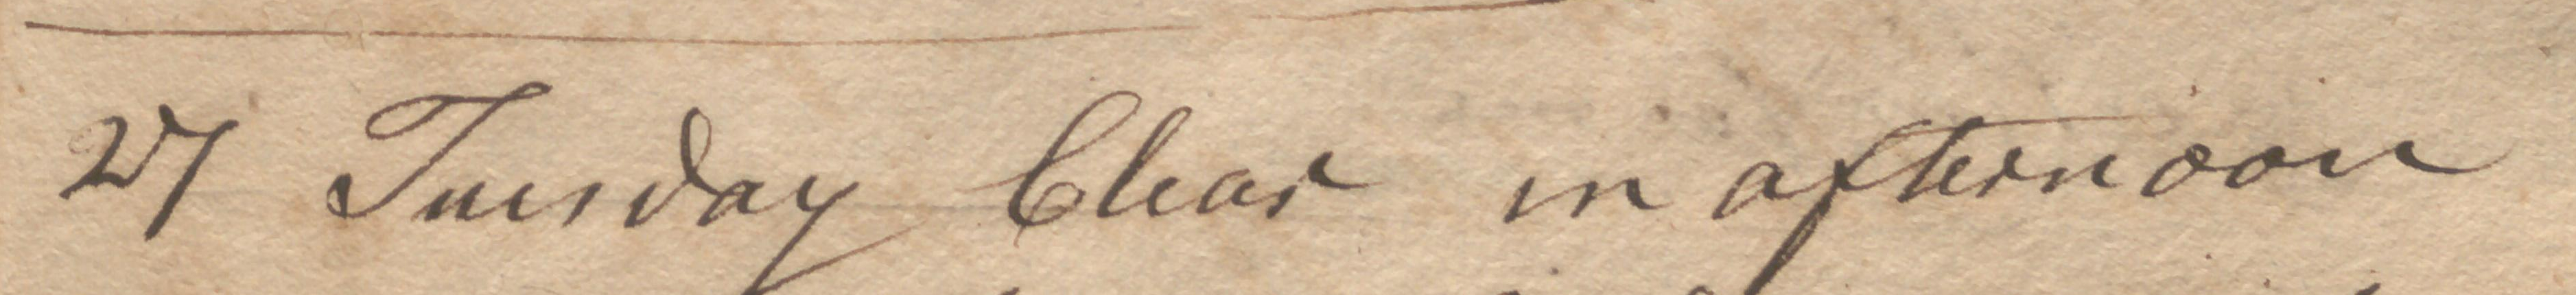27 Tuesday Clear in afternoon
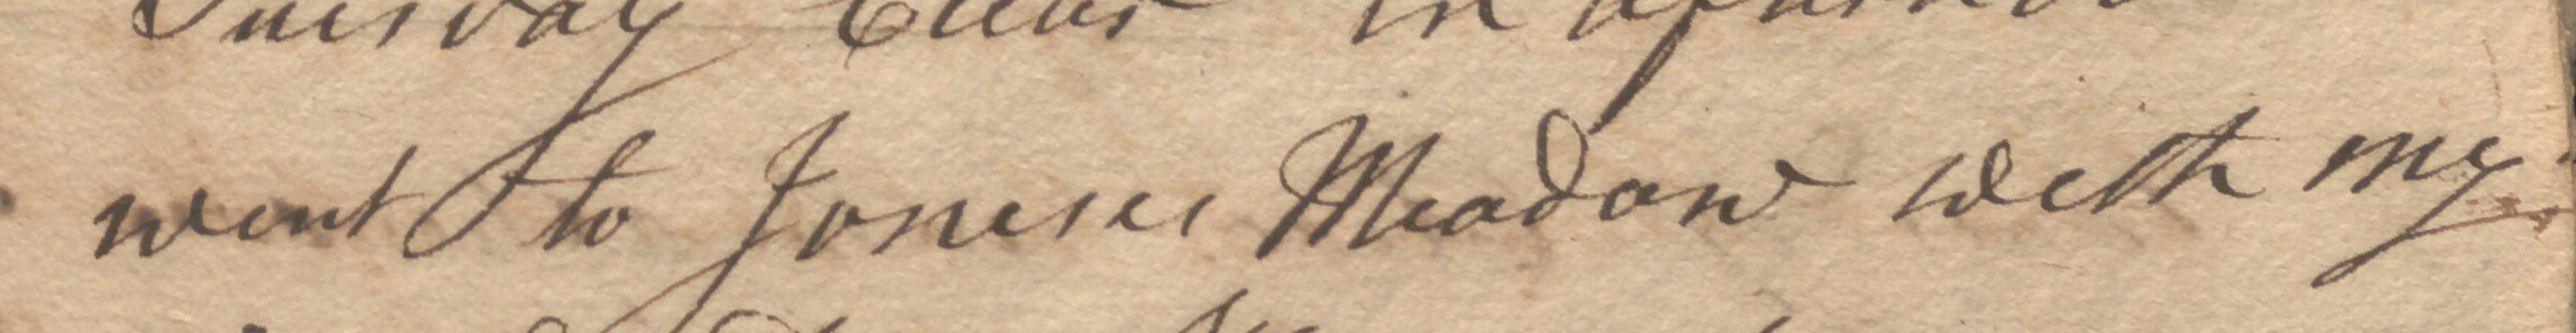went to Joneses Meadow with my
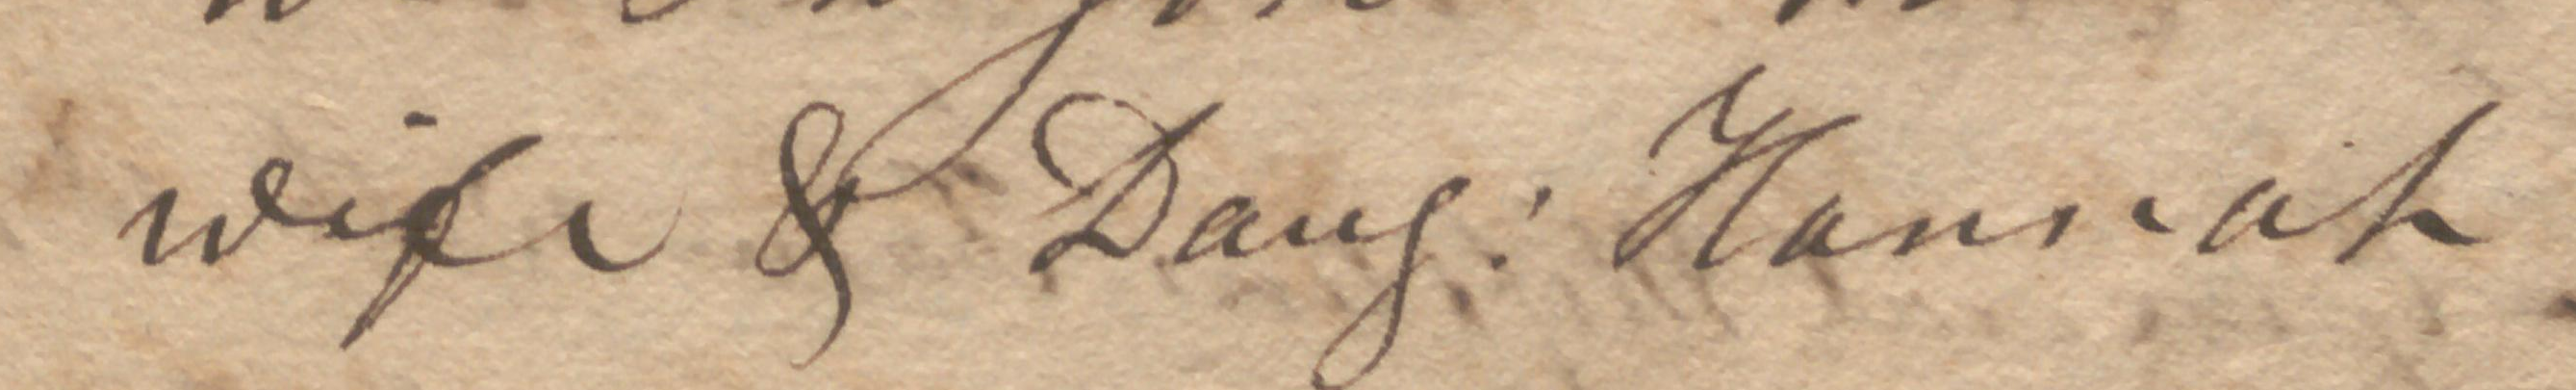wife & Daug: Hannah
